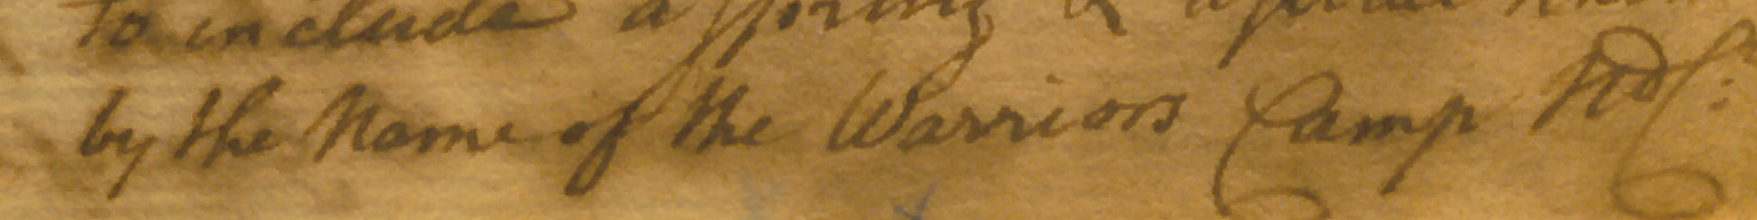by the Name of the Warriors Camp N^d C^o:
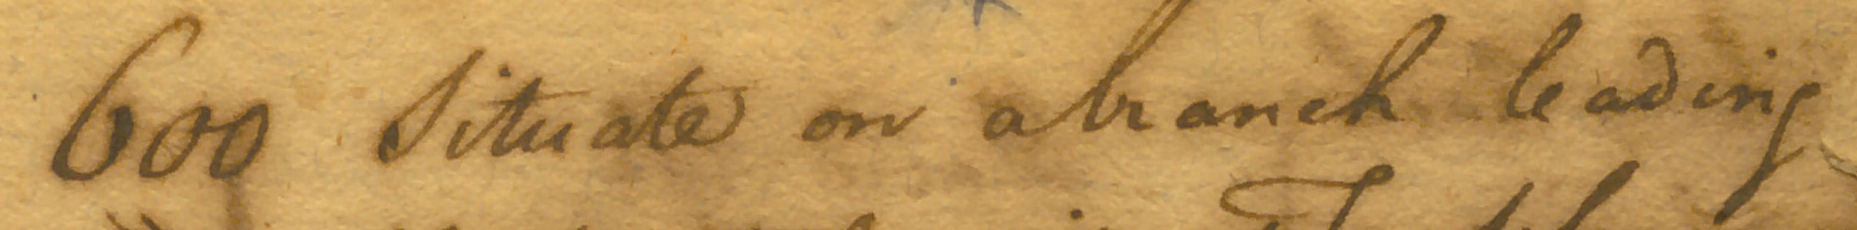600 Situate on a branch leading
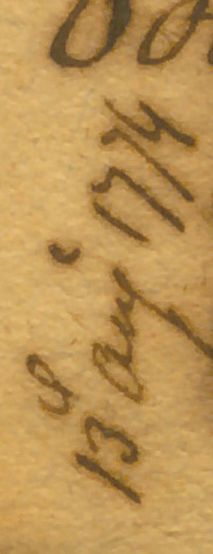13^th Aug^t 1774
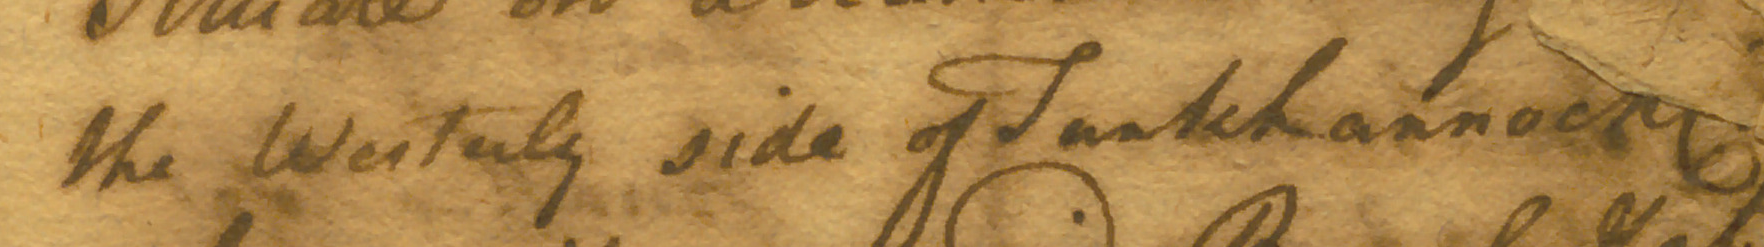the Westerly side of Tunkhannock
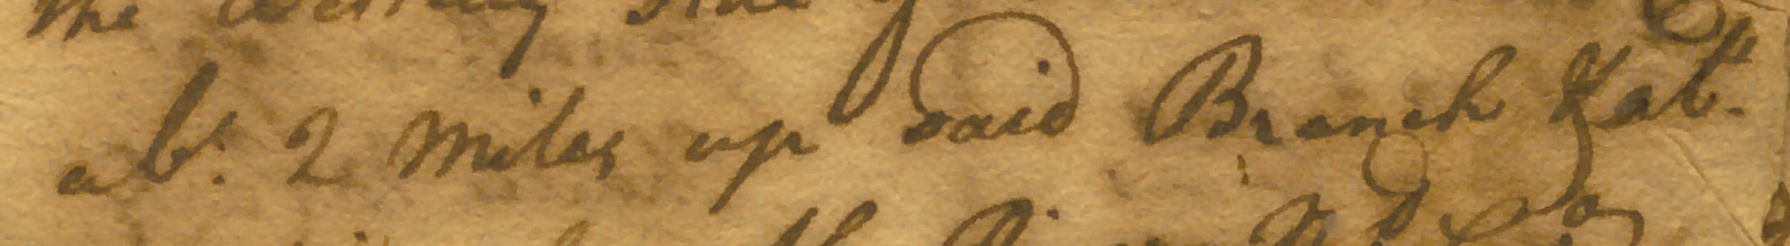abt. 2 Miles up said Branch & at.
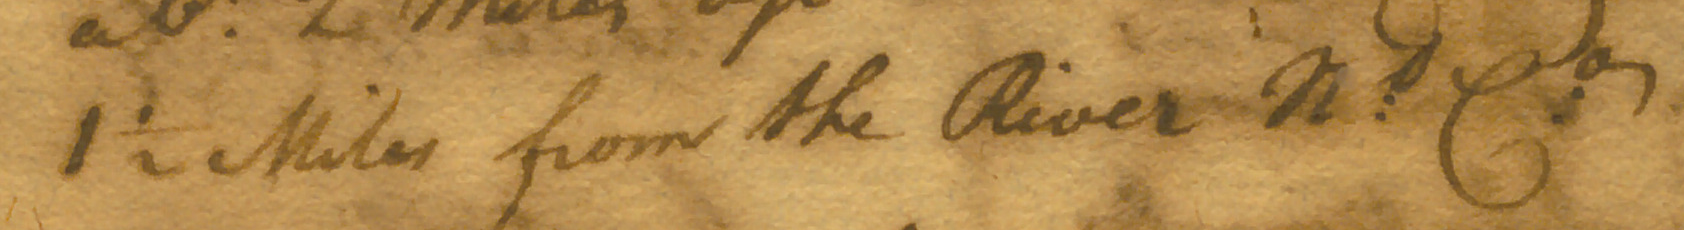1 1/2 Miles from the River N^d: C^o:
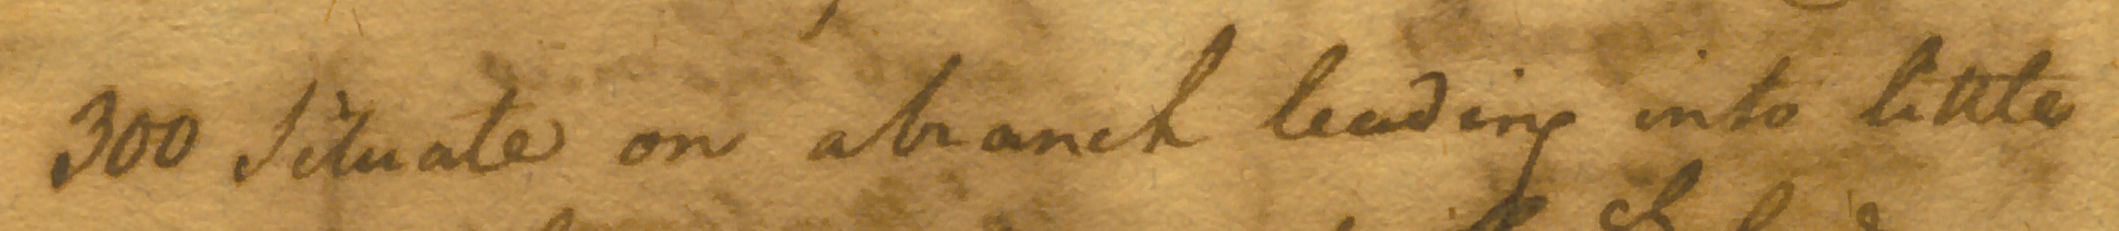300 Situate on a branch leading into little
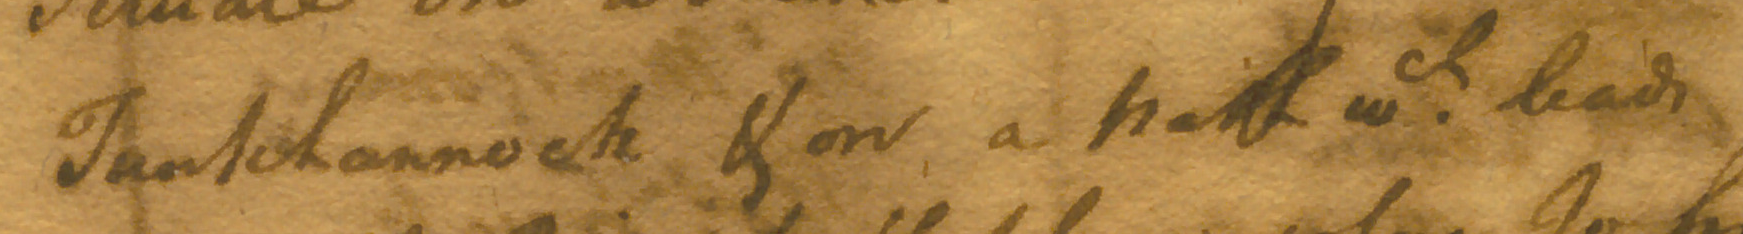Tunkhannock & on a path w^ch. leads
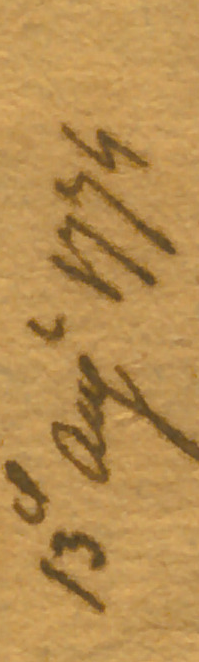13^th Aug^t 1774
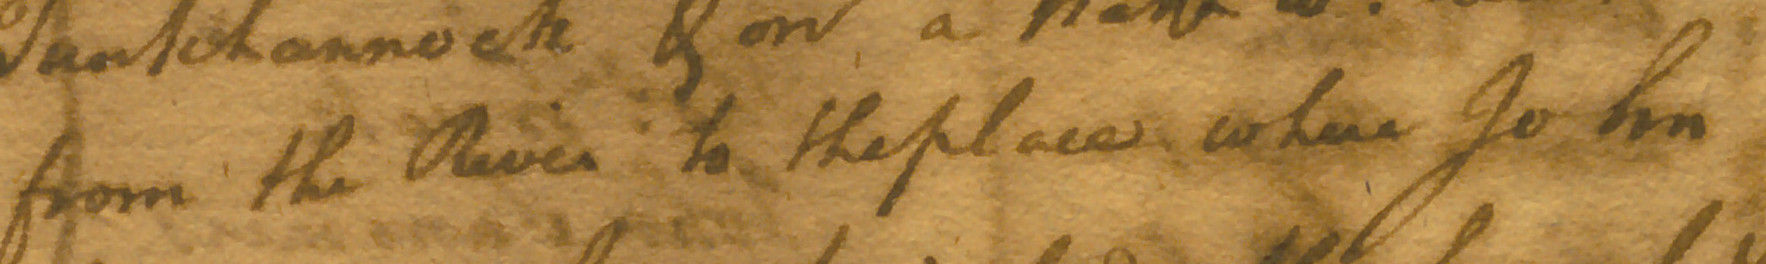from the River to the place where John
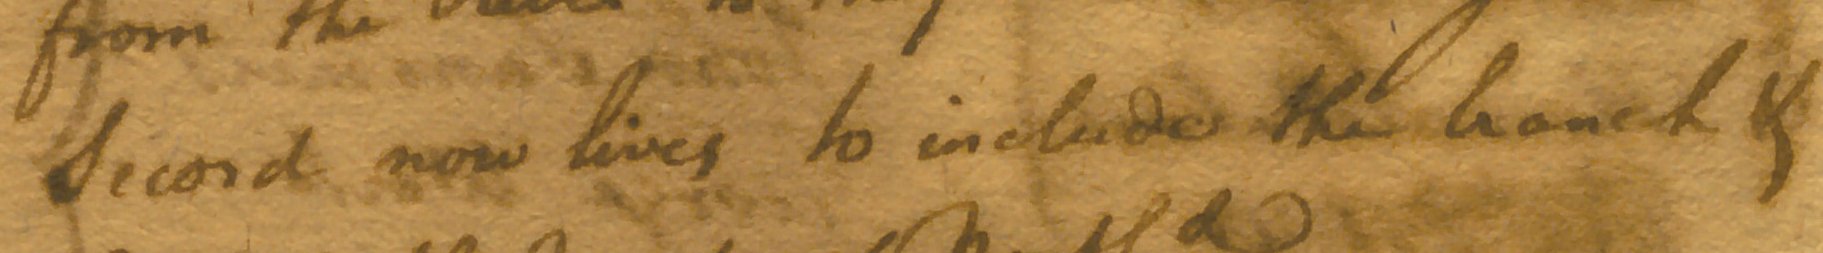Secord now lives to include the branch &
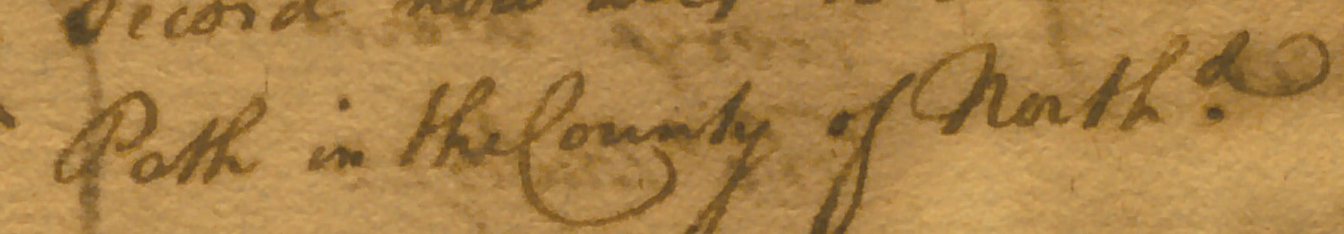Path in the Country of North^d.
